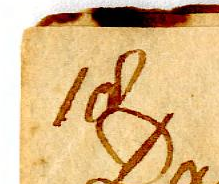18
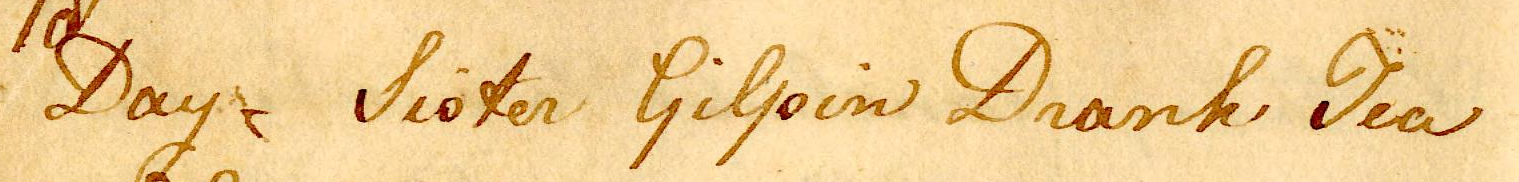Day Sister Gilpin Drank Tea
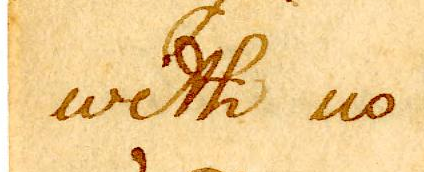with us
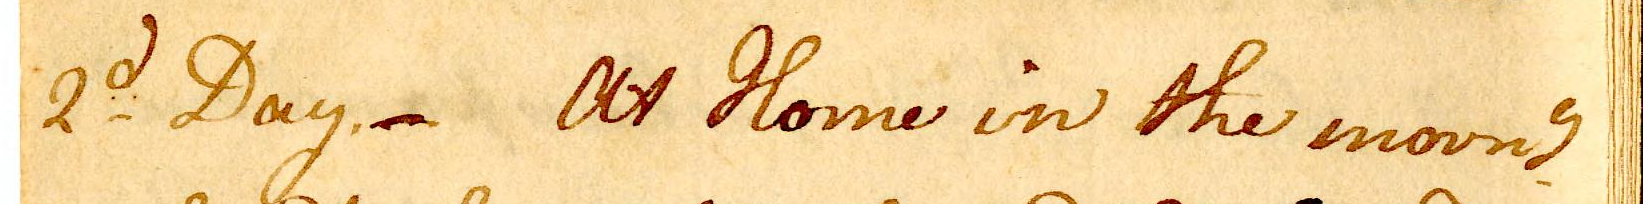2^d Day- At Home in the morn^g
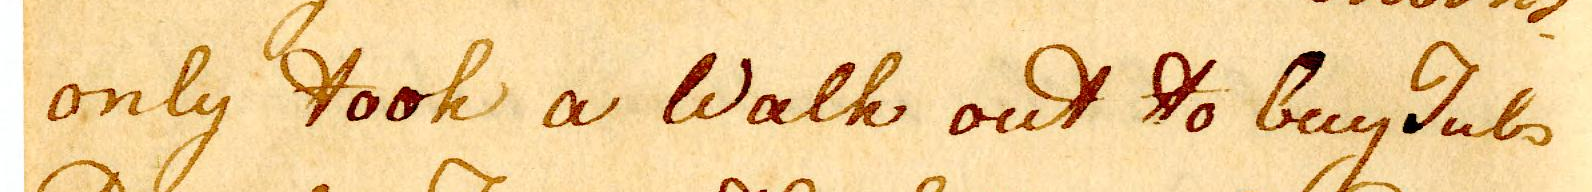only took a Walk out to buy Tubs
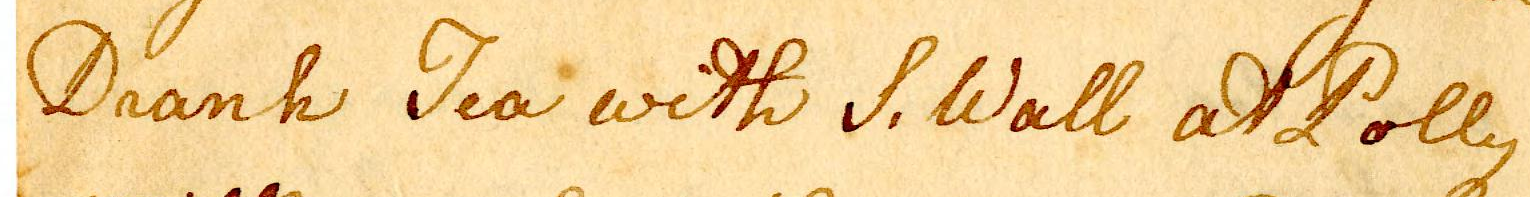Drank Tea with S. Wall at Polly
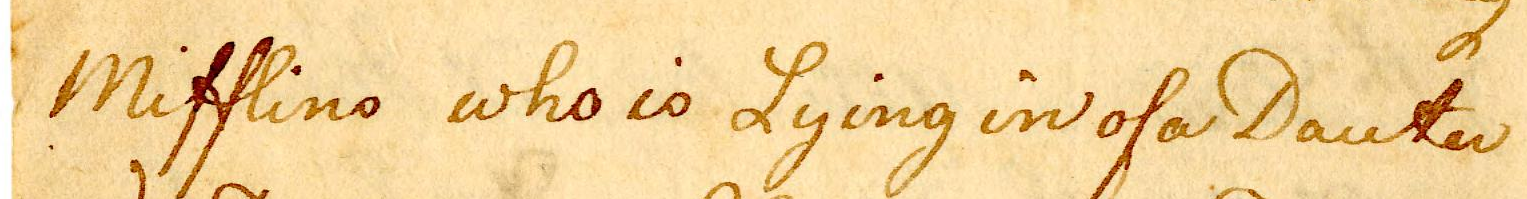Mifflins who is Lying in of a Dauter
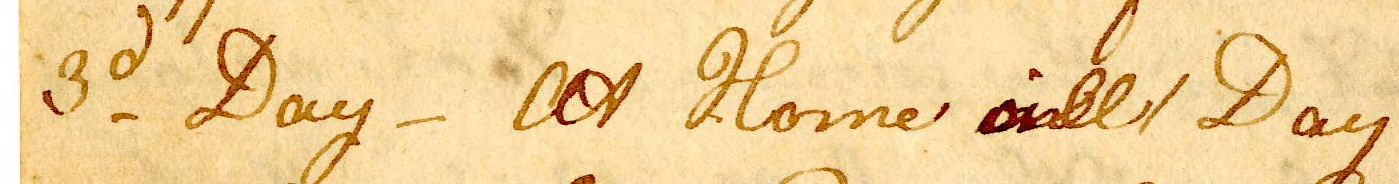3^d Day- At Home [all] Day
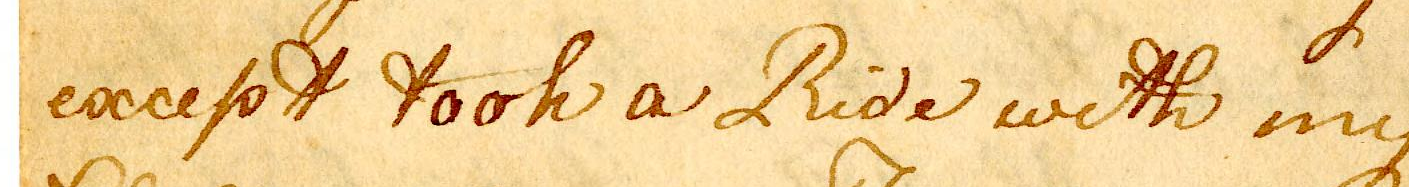except took a Ride with my
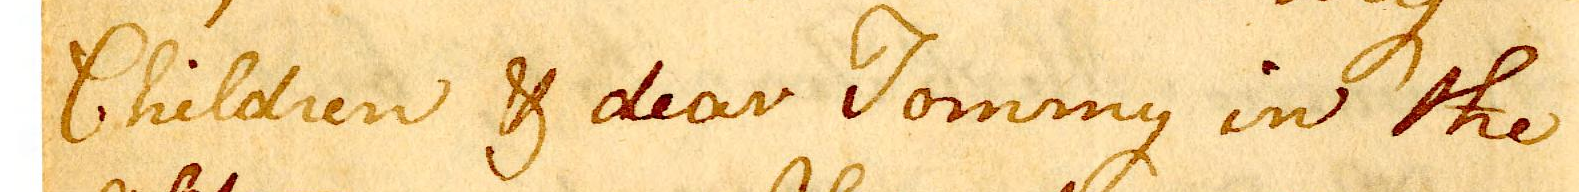Children & dear Tommy in the
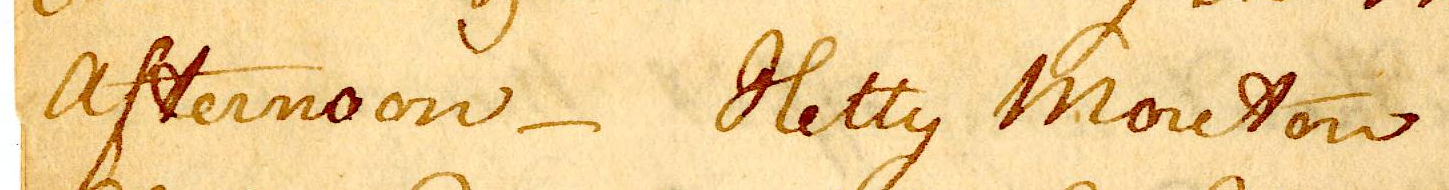Afternoon- Hetty Moreton
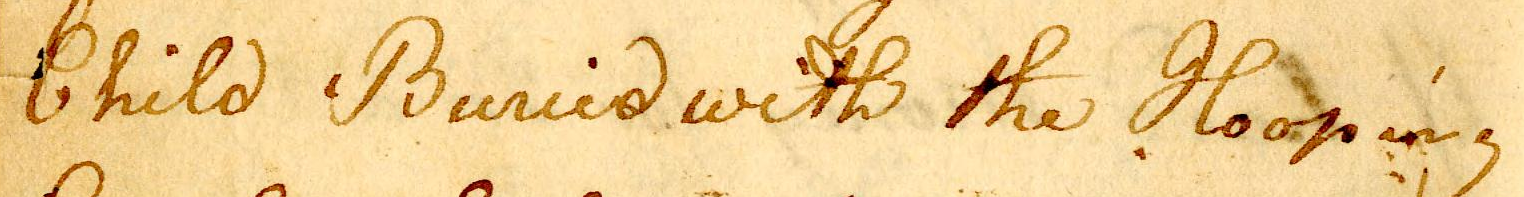Child Buried with the Hooping
